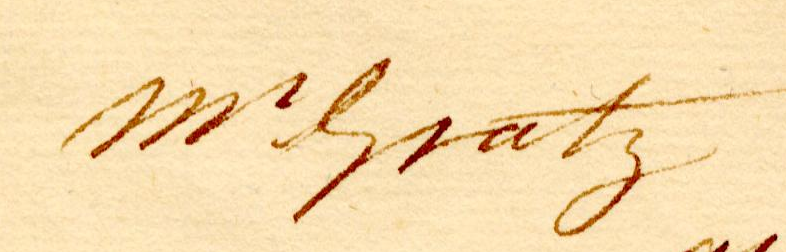M^r Gratz
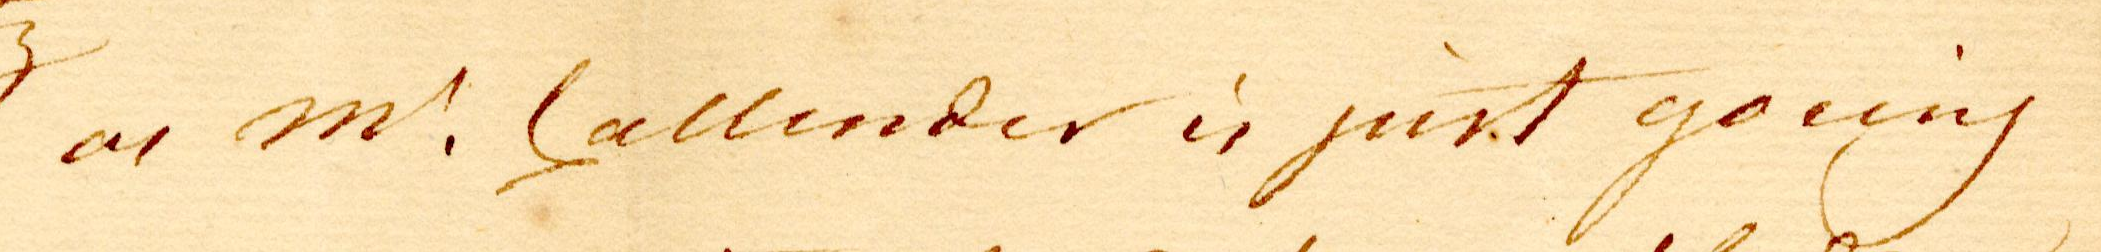as M^r. Callender is just going
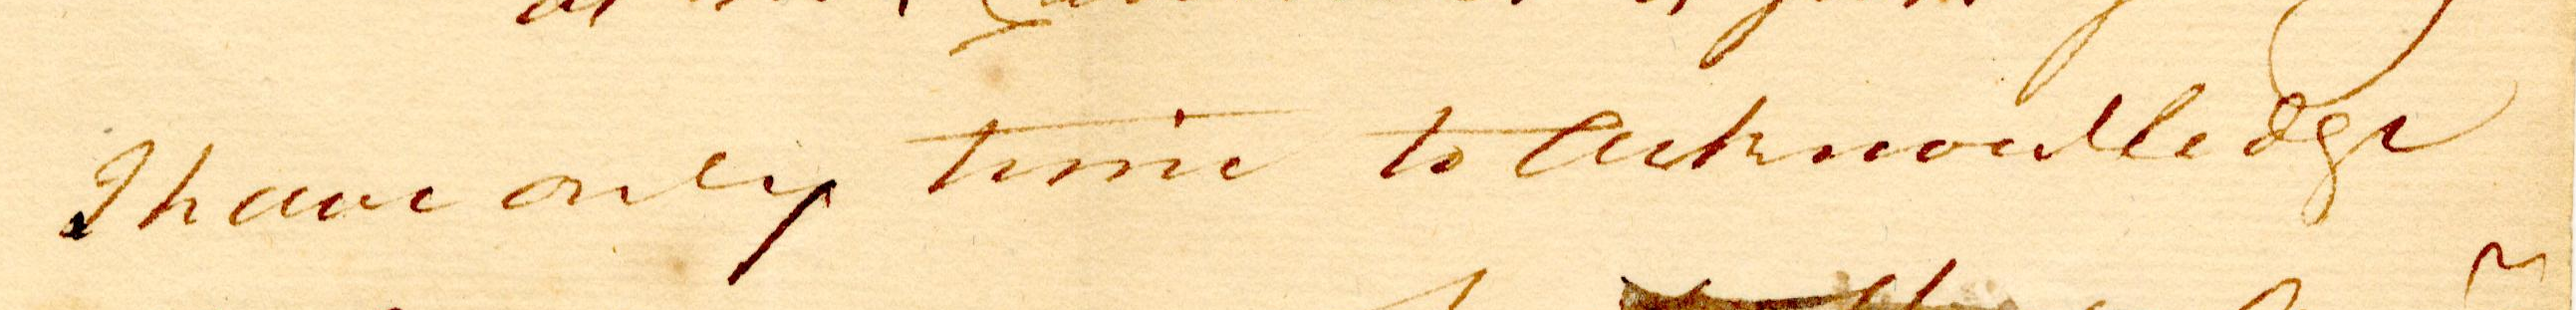I have only time to acknowledge
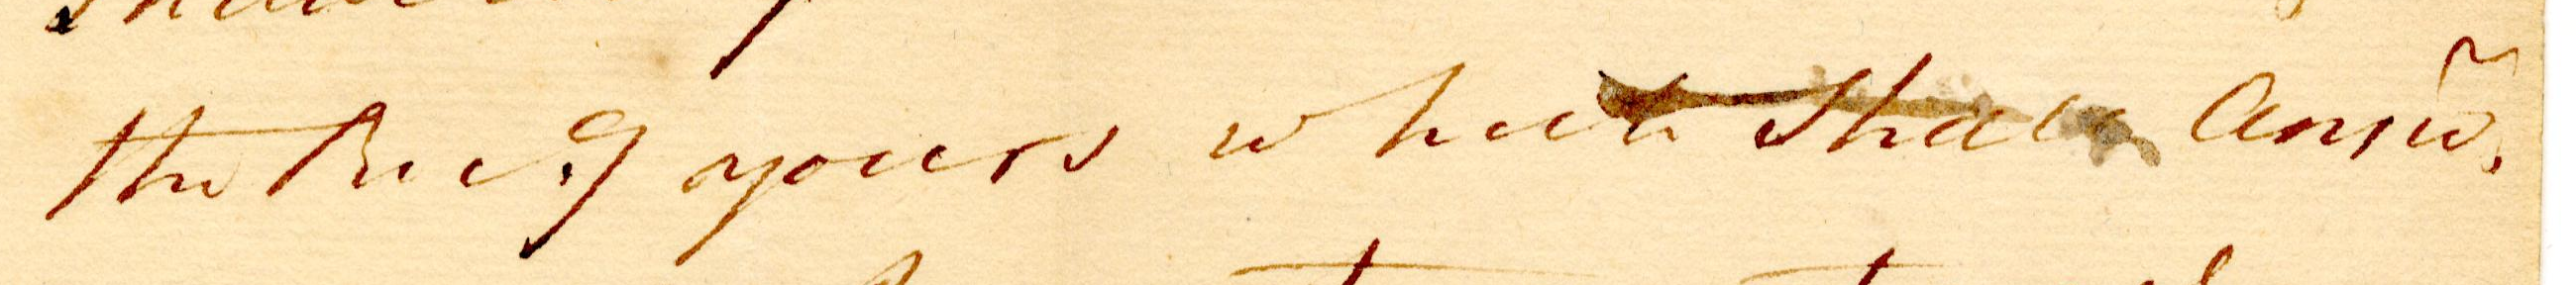the Rec^g. yours which shall Answ^r.
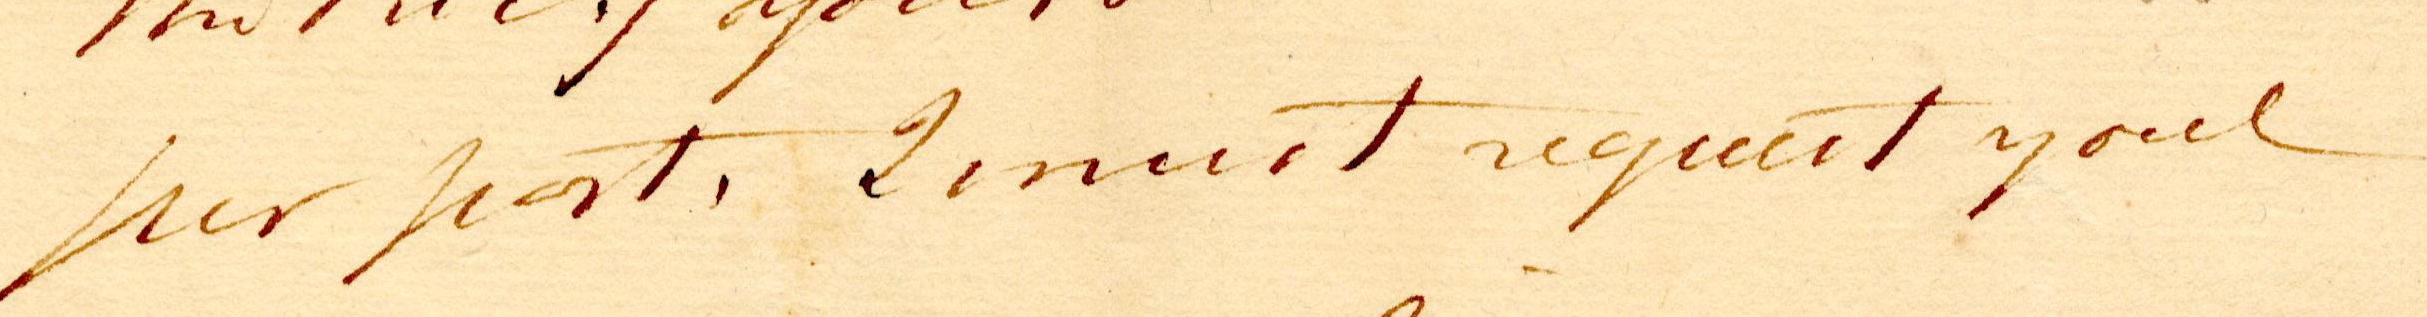per post. I must request youl
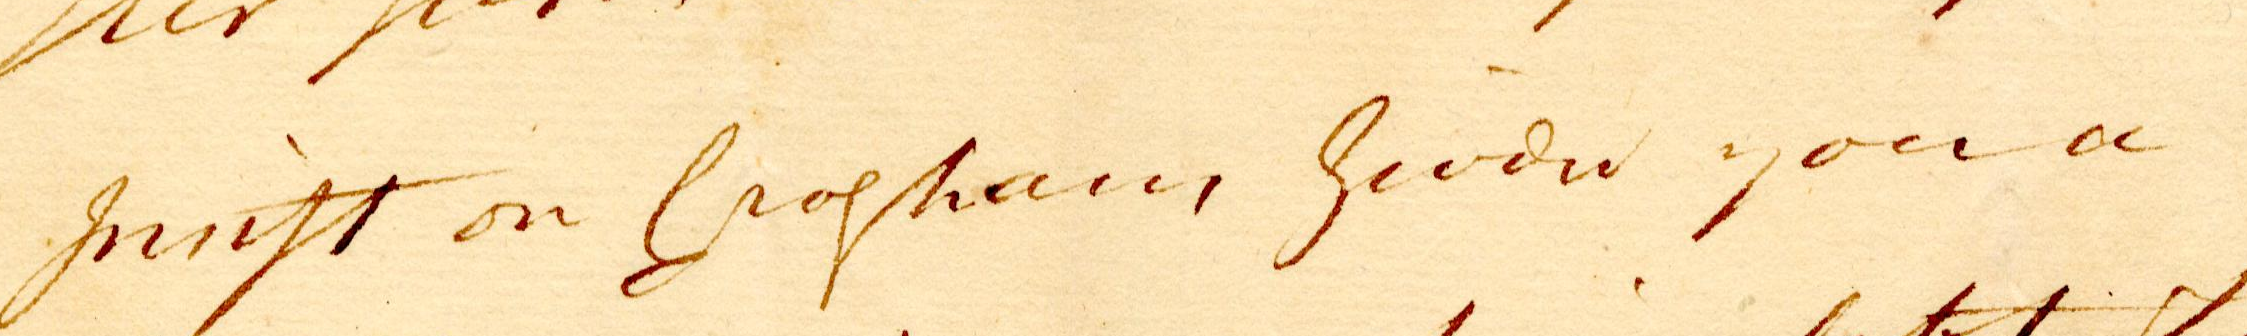insist on Croghans given your a
